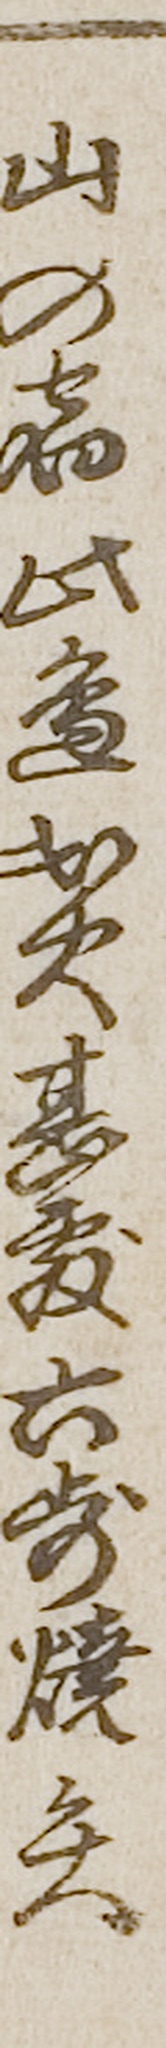山の宿此邊出火甚敷六歩焼失
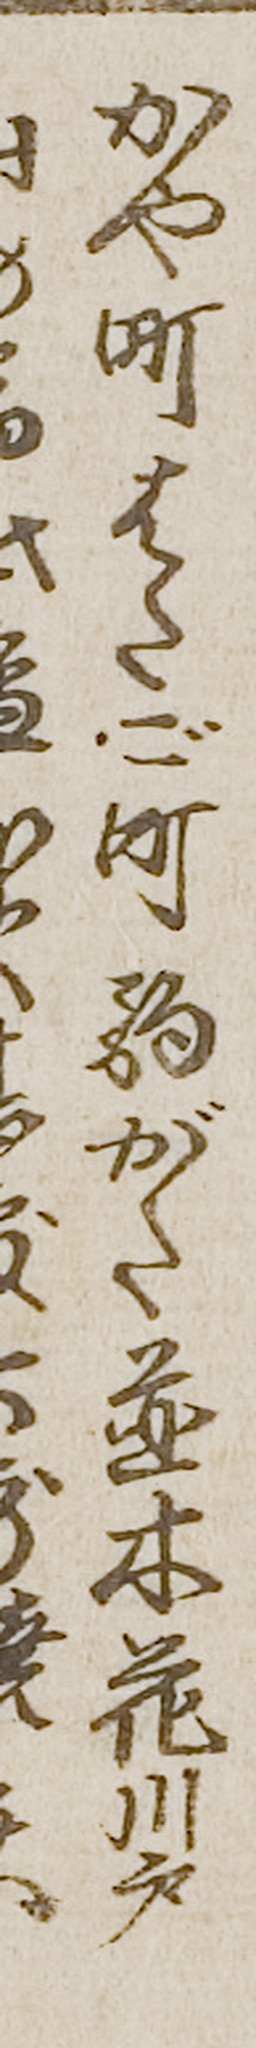山の宿此邊出火甚敷六歩焼失
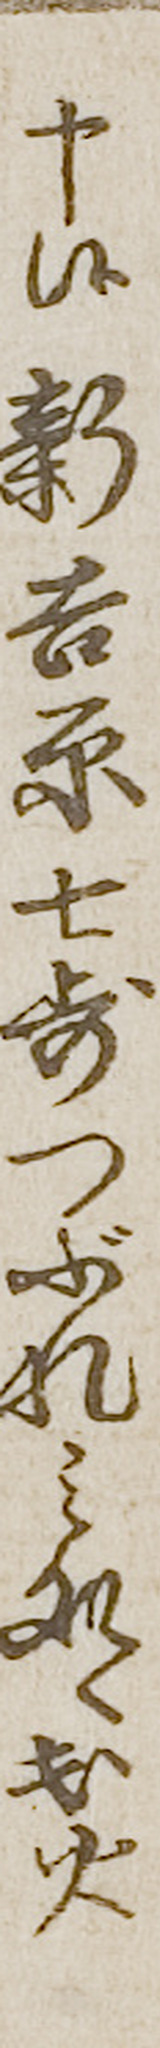申候新吉原七歩つぶれ之処へ出火
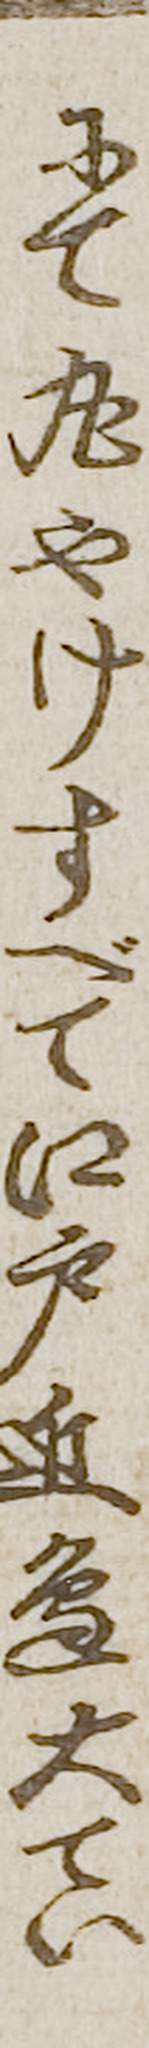にて丸やけすべて江戸近邊大てい
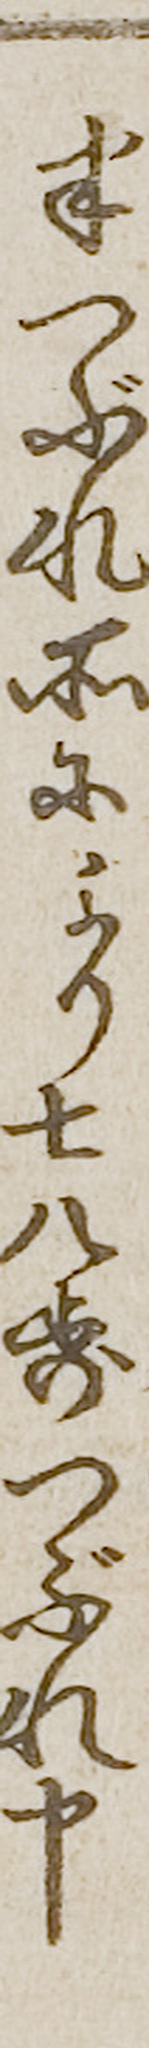半つぶれ所により七八歩つぶれ申
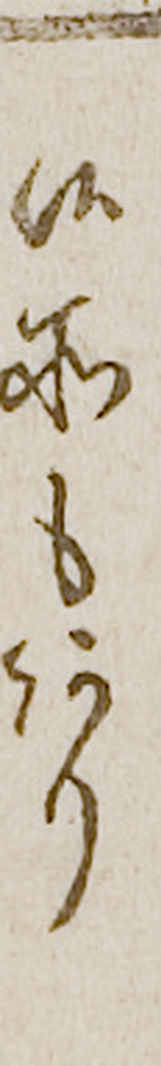候所もあり
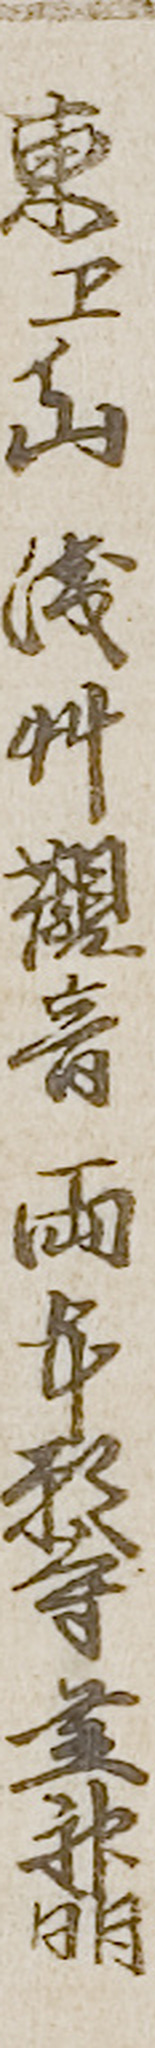東ヱイ山淺艸観音両本願寺芝神明
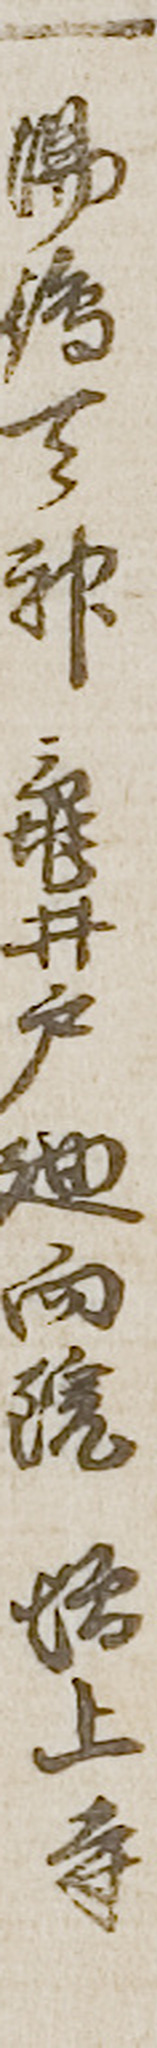湯嶋天神亀井戸廻向院増上寺
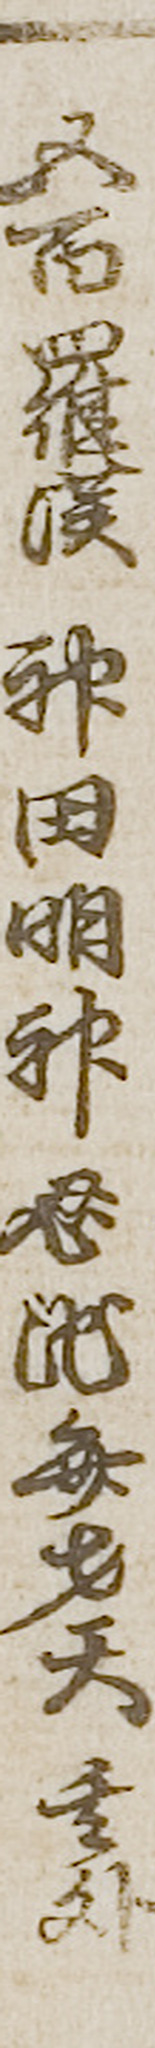五百羅漢神田明神忍池弁財天其外
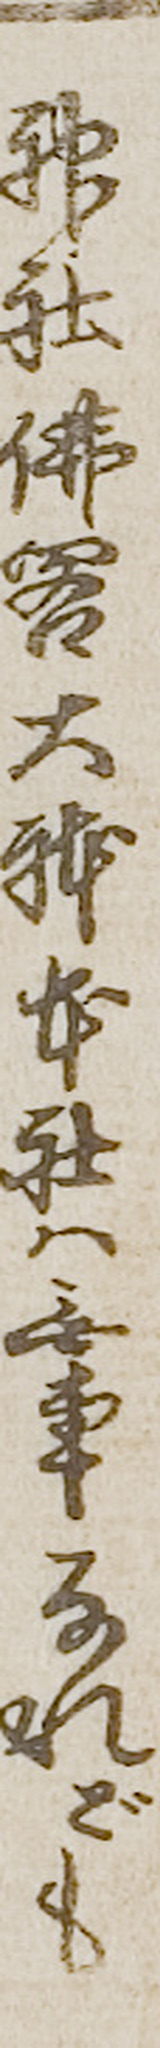神社佛閣大躰本社ハ無事なれども
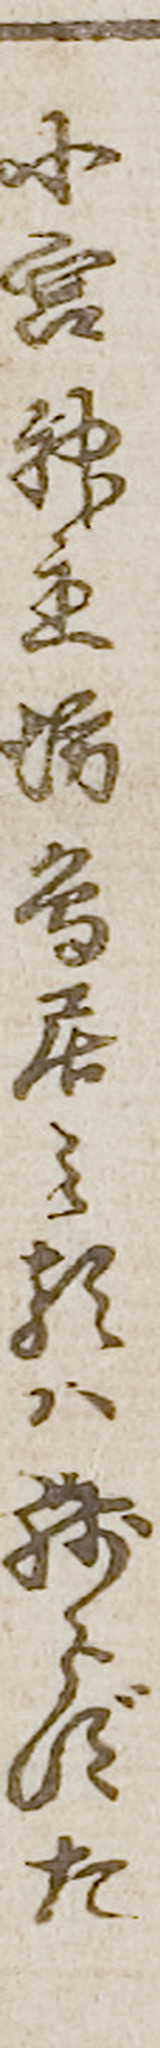小宮神主坊鳥居之類ハ残らずた
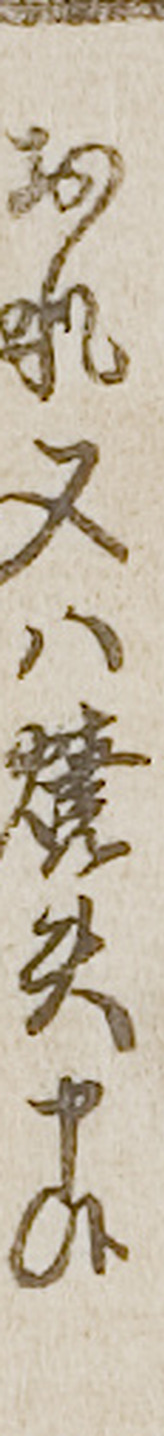おれ又ハ焼失申候
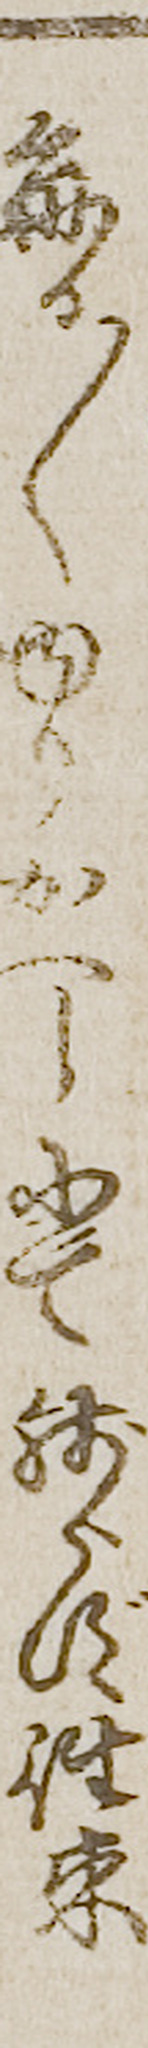毎日〳〵ゆりかえしにて残らず往来
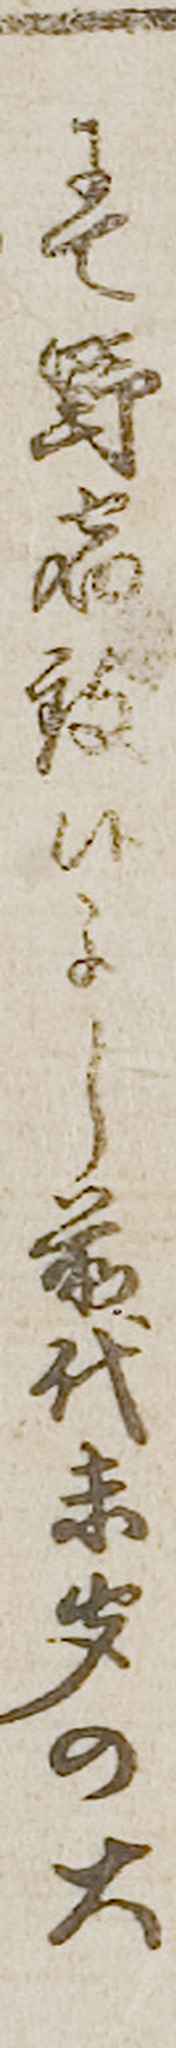にて野宿致候よし前代未聞の大
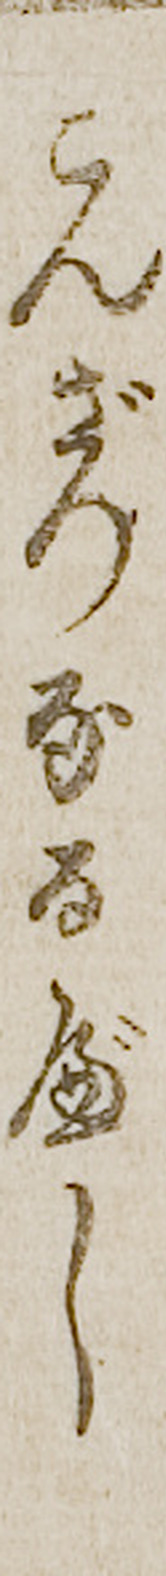こんざつなるべし
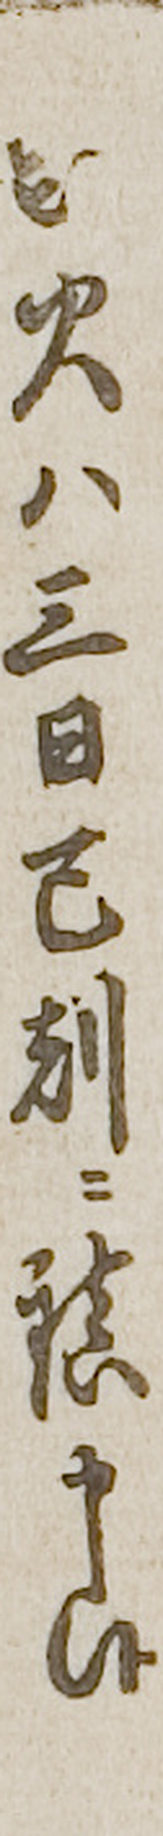出火ハ三日巳刻ニ鎮申候
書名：江戸大地震出火次第
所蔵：東京大学総合図書館 General Library in the University of Tokyo, JAPAN
